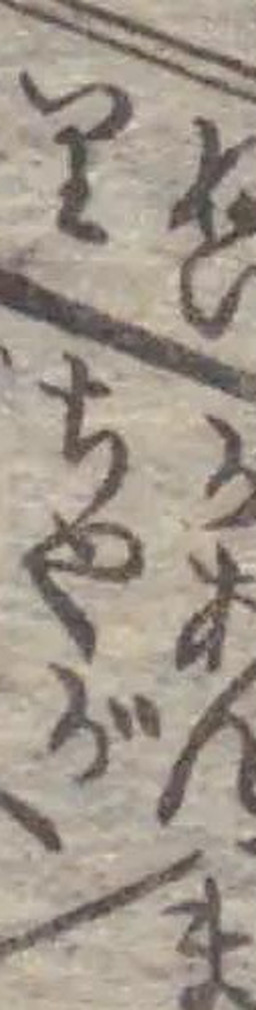りちやが
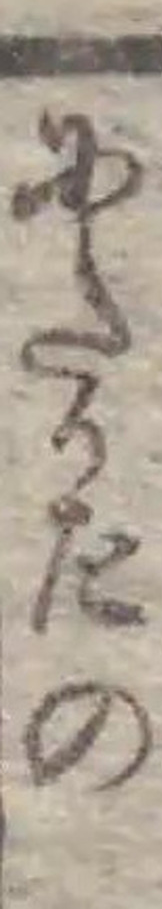にたかたの
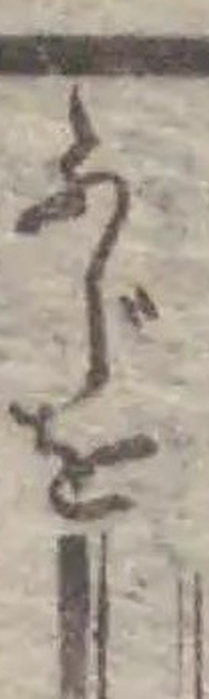ふじを
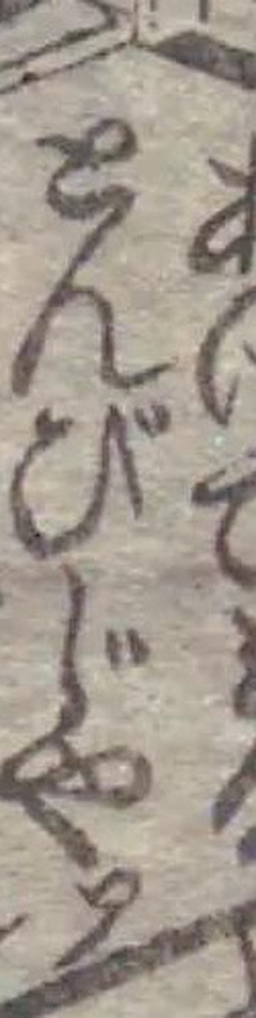とんびじやア
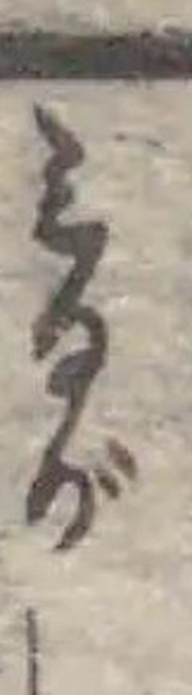みるが
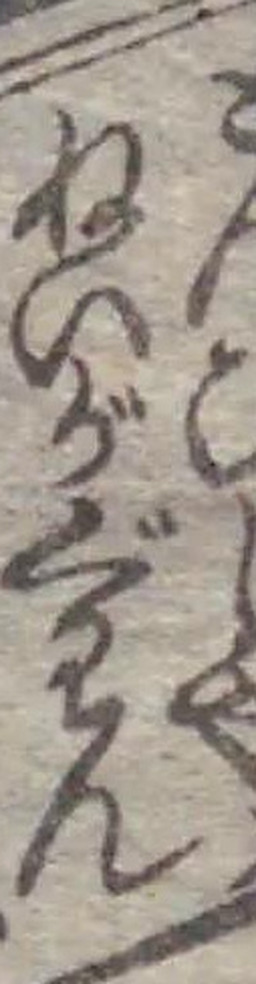ねいがぐわん
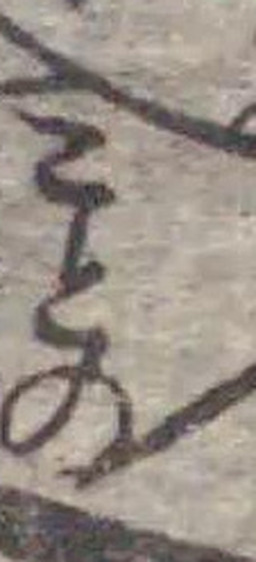ことの
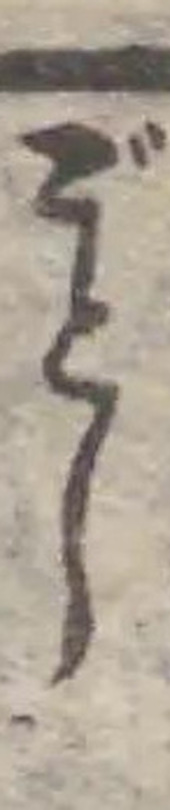ごとし
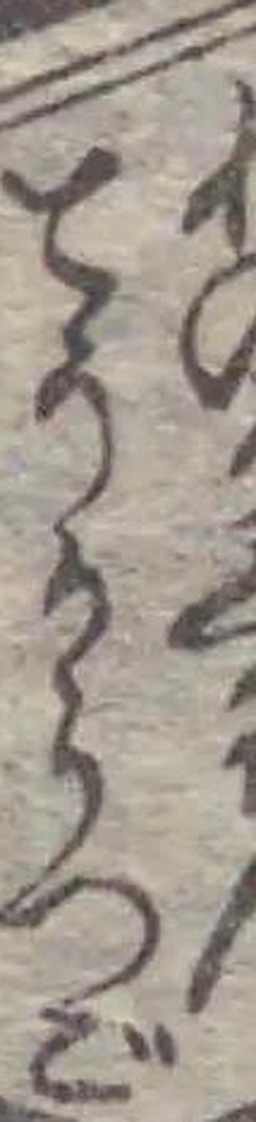てうからつご
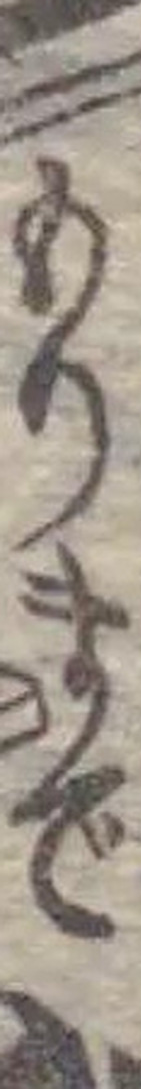もりまで
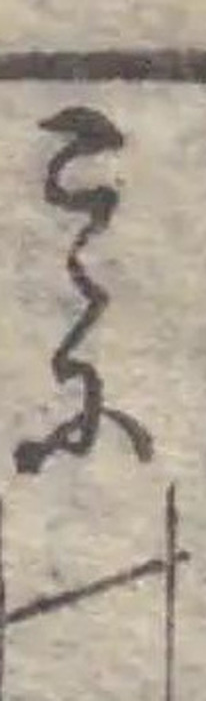こゝに
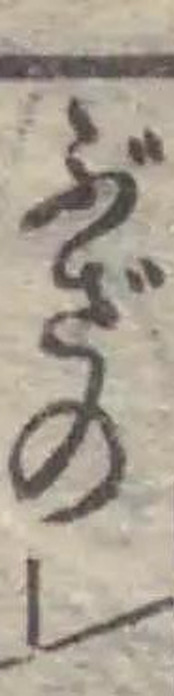ぶざの
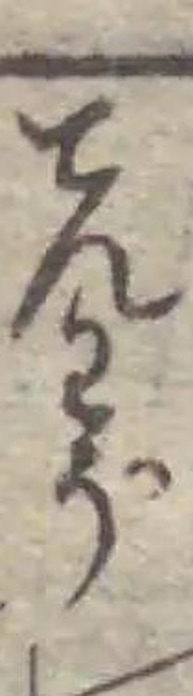てんわう
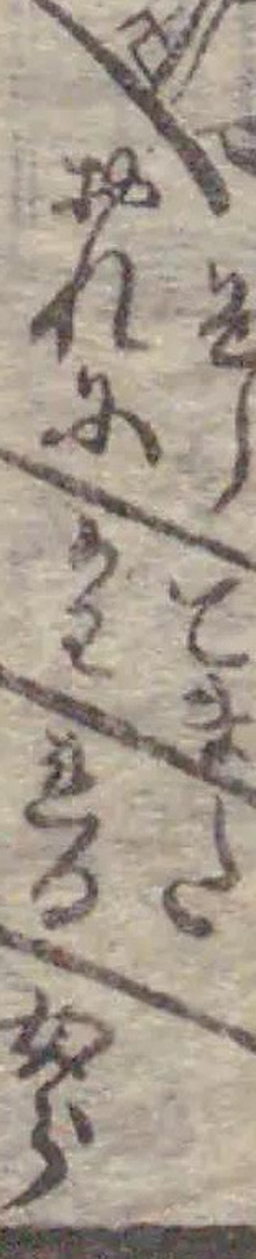おれにかわれる女郎
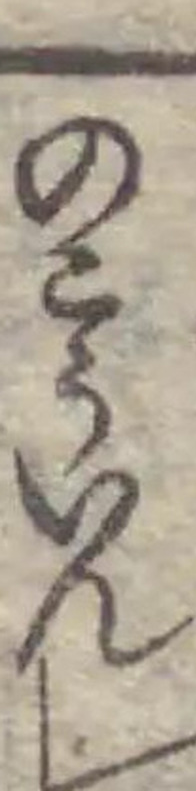のこういん
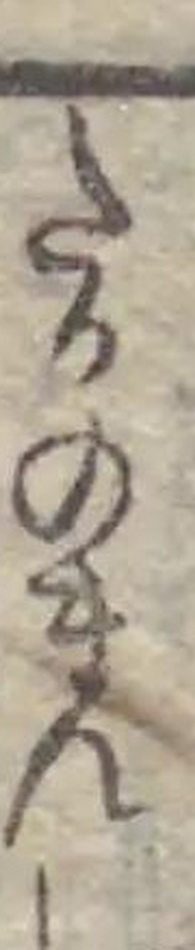たかのまん
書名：かんなんの夢枕 2巻
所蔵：国立国会図書館 National Diet Library, JAPAN
